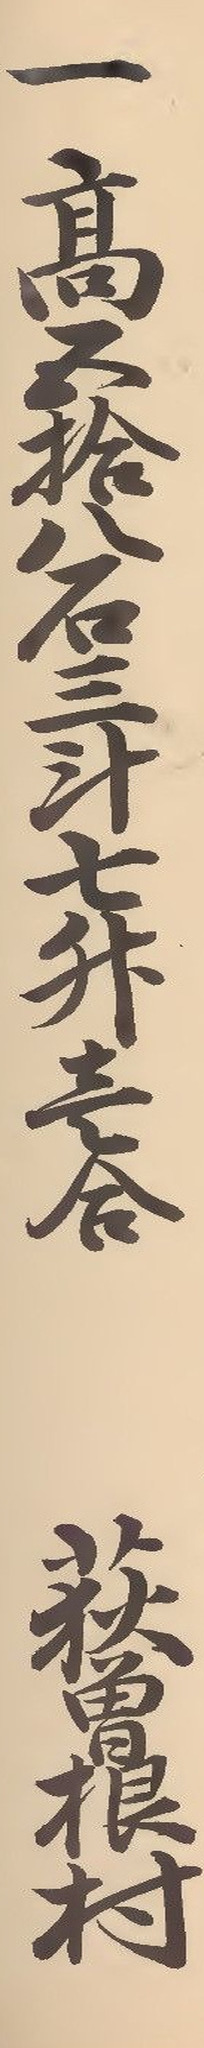一高五拾八石三斗七升壱合荻曽根村
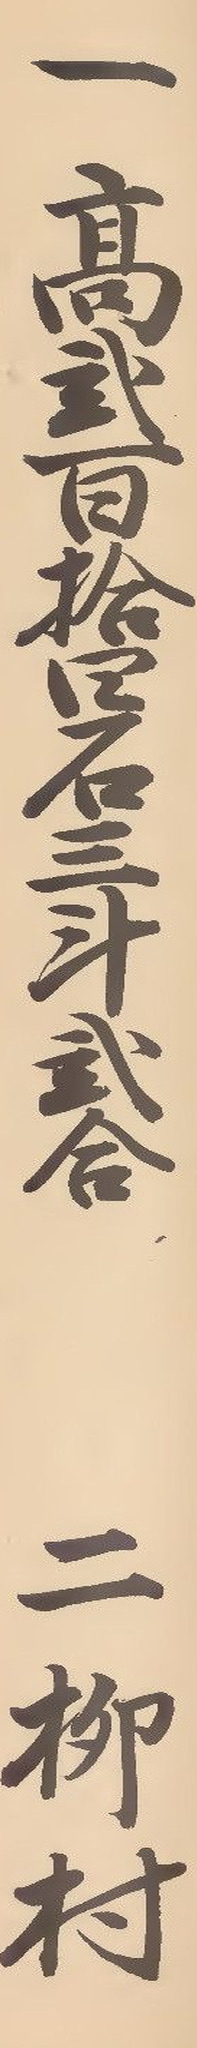一高弐百拾四石三斗弐合二柳村
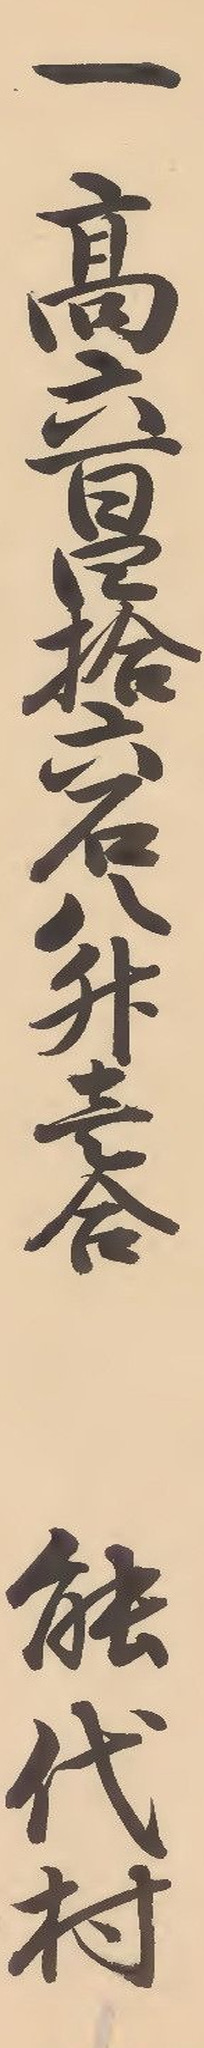一高六百四拾六石八升壱合能代村
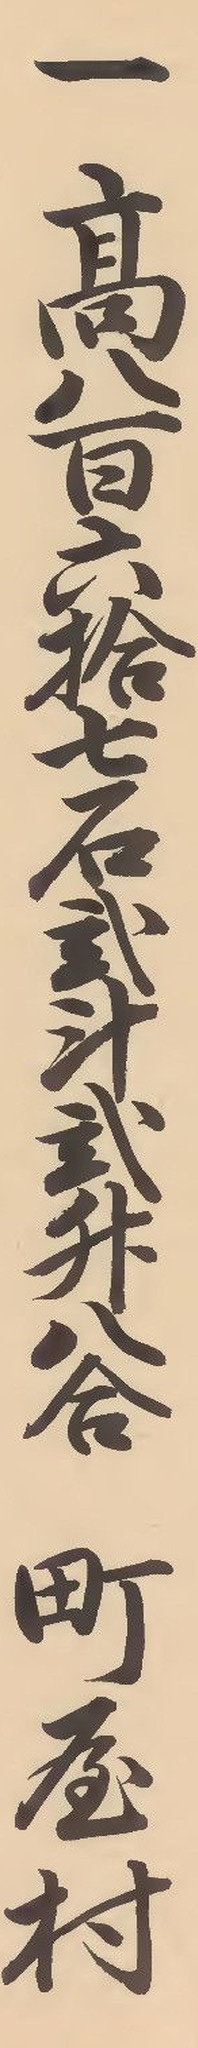一高八百六拾七石弐斗弐升八合町屋村
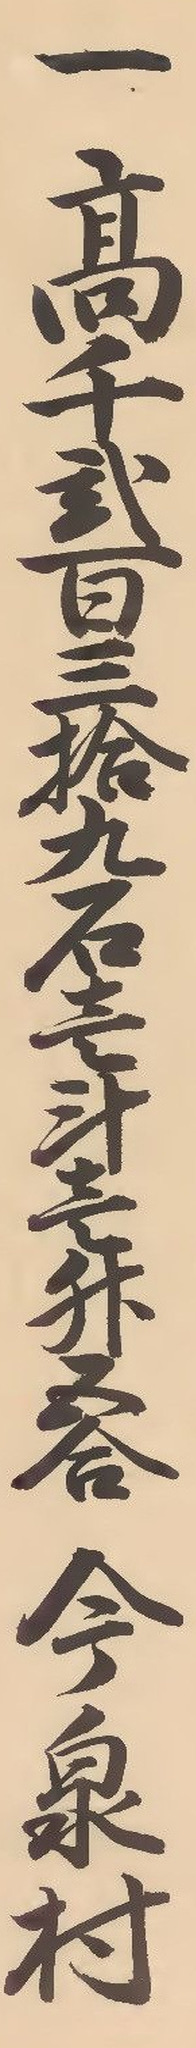一高千弐百三拾九石壱斗壱升五合今泉村

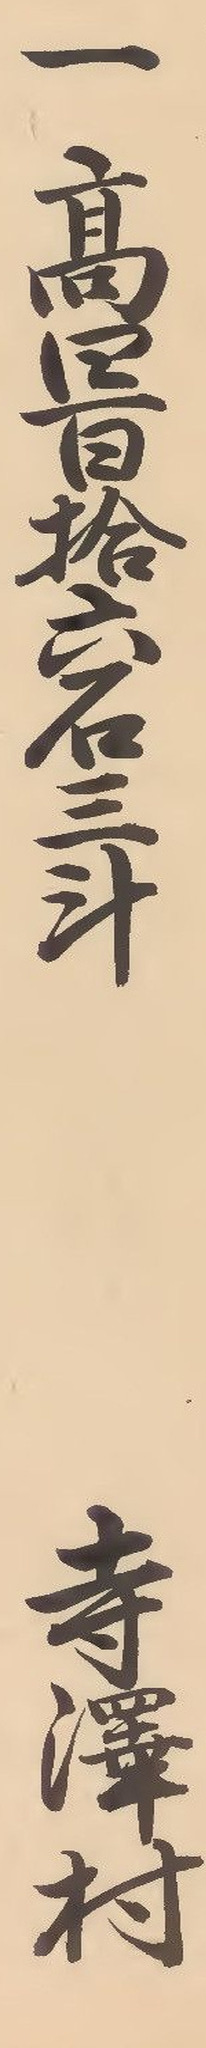一高四百拾六石三斗寺沢村
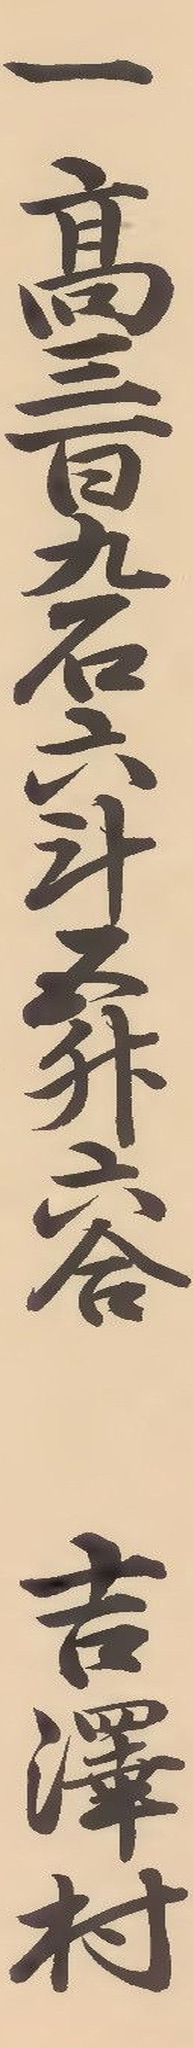一高三百九石六斗五升六合吉沢村
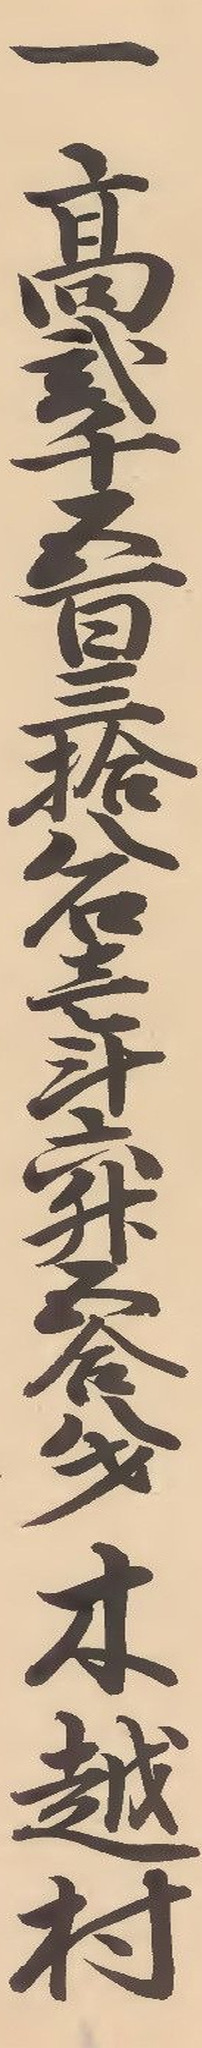一高弐千五百三拾八石壱斗六升五合八勺木越村
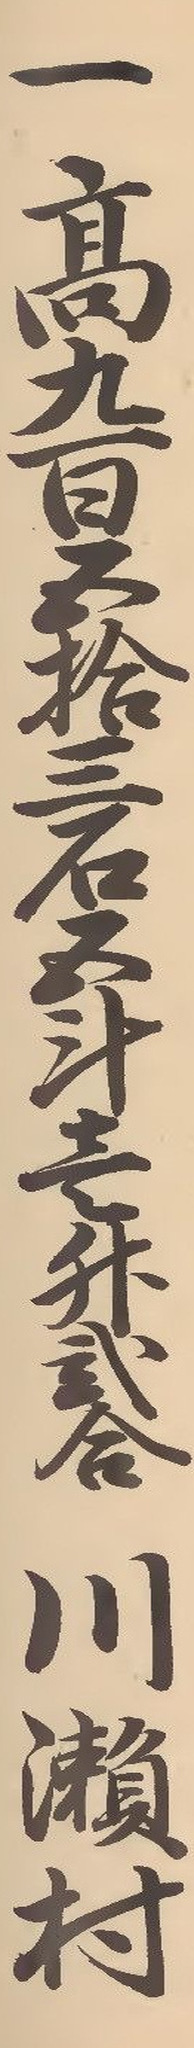一高九百五拾三石五斗壱升弐合川瀬村
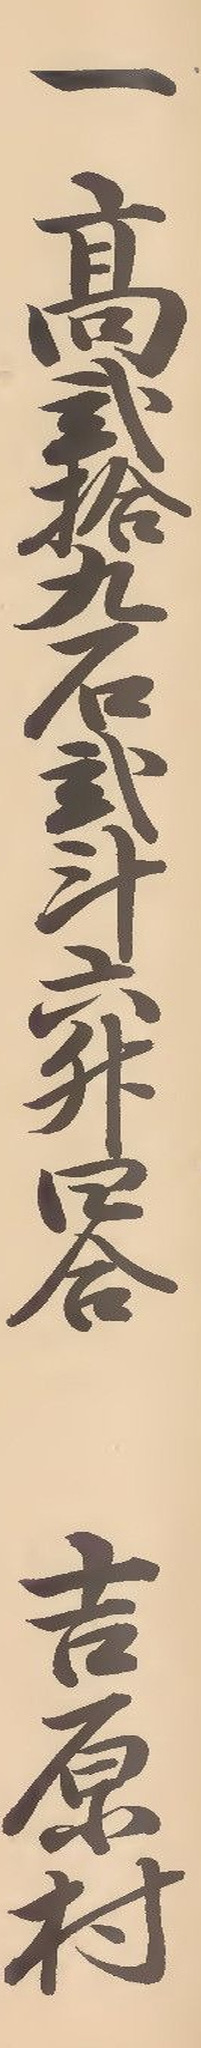一高弐拾九石弐斗六升四合吉原村
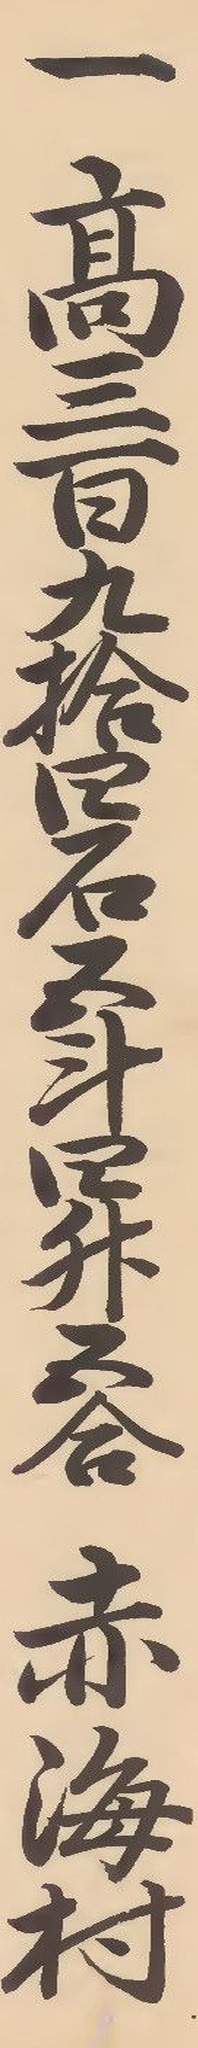一高三百九拾四石五斗四升五合赤海村
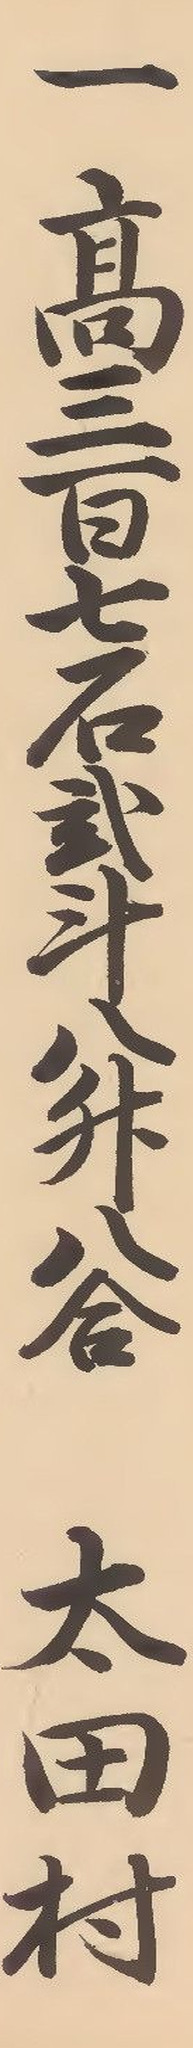一高三百七石弐斗八升八合太田村
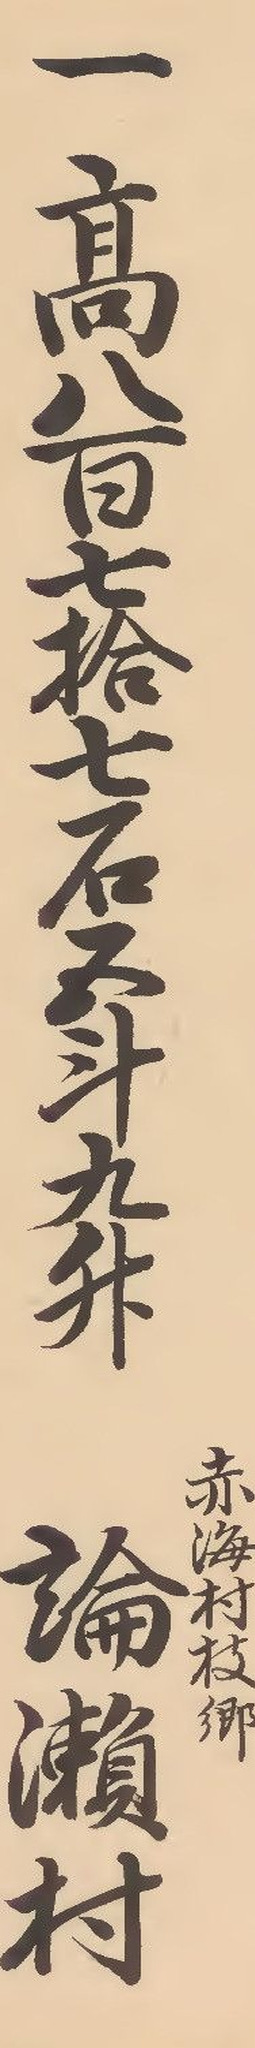一高八百七拾七石五斗九升論瀬村

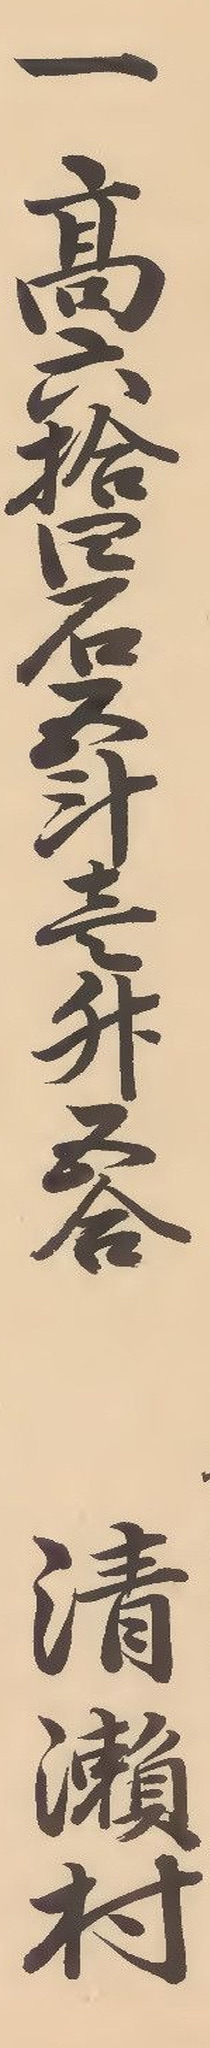一高六拾四石五斗壱升五合清瀬村
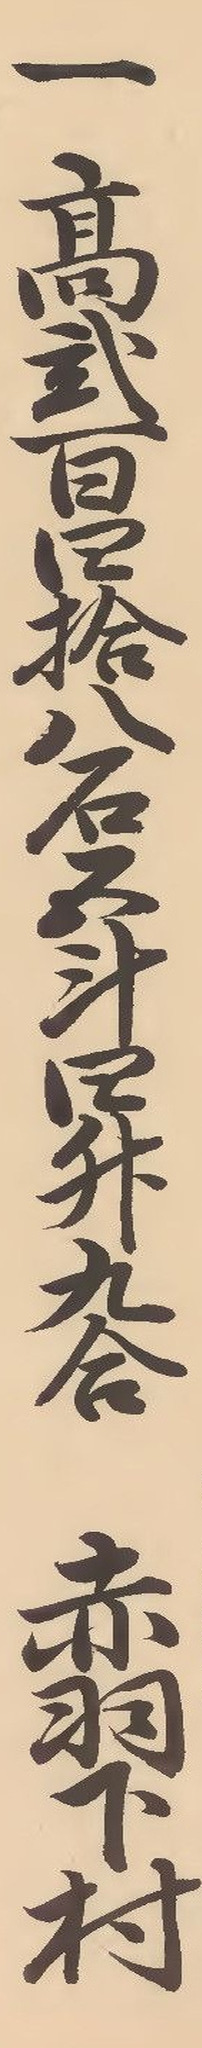一高弐百四拾八石五斗四升九合赤羽下村
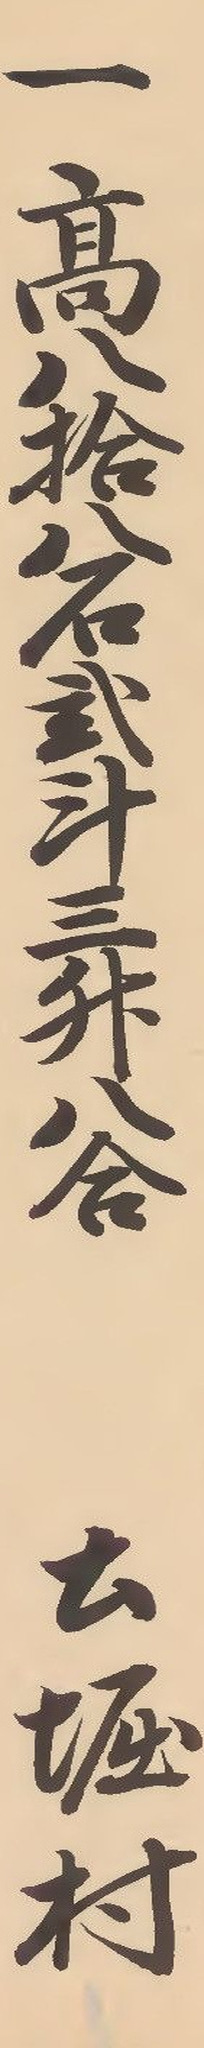一高八拾八石弐斗三升八合土堀村
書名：越後国郷帳　下
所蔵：国立公文書館 National Archives of Japan
